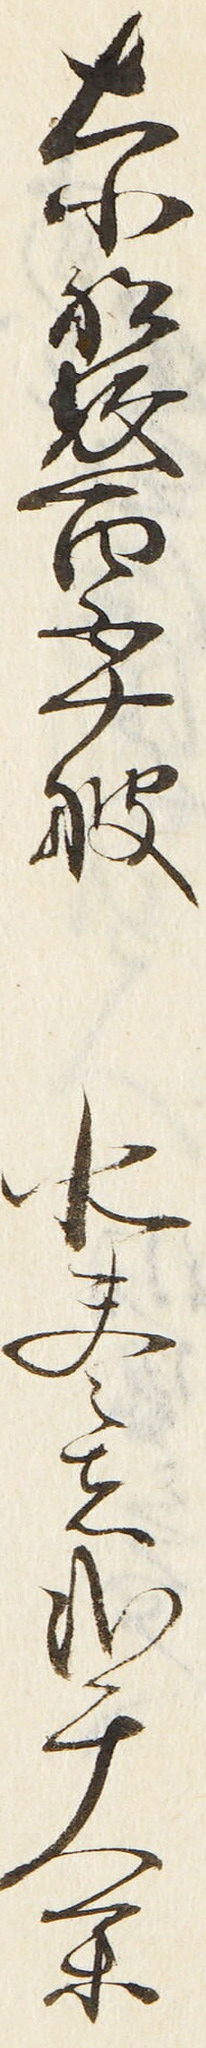大小船数百五十艘水夫之者弐千人余
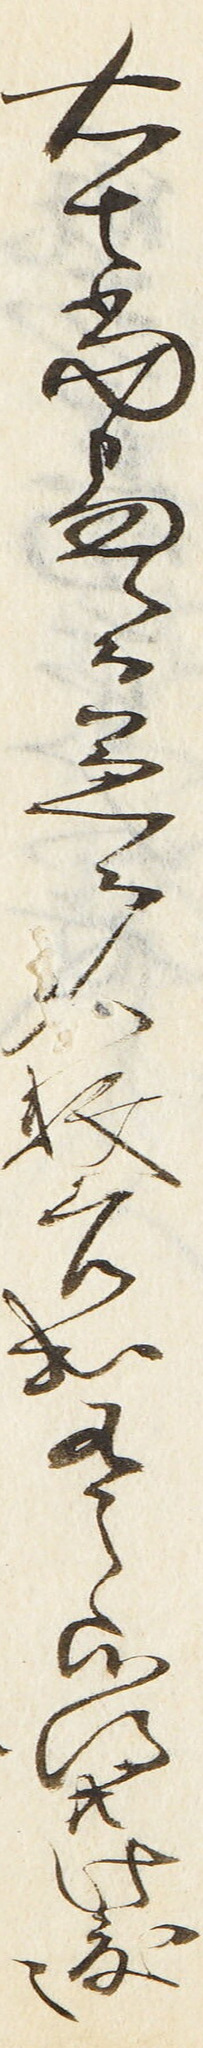右は当番にて兼て人数差出有之候得共此度之
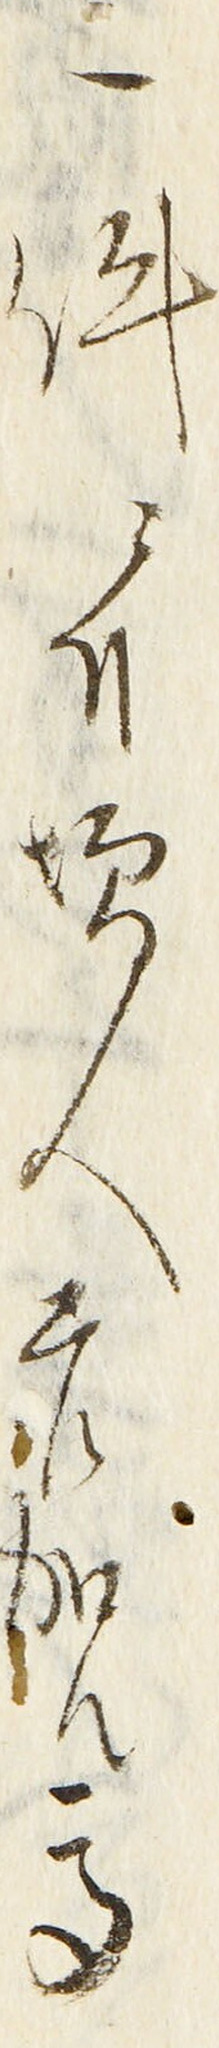一件に付増人差加候高
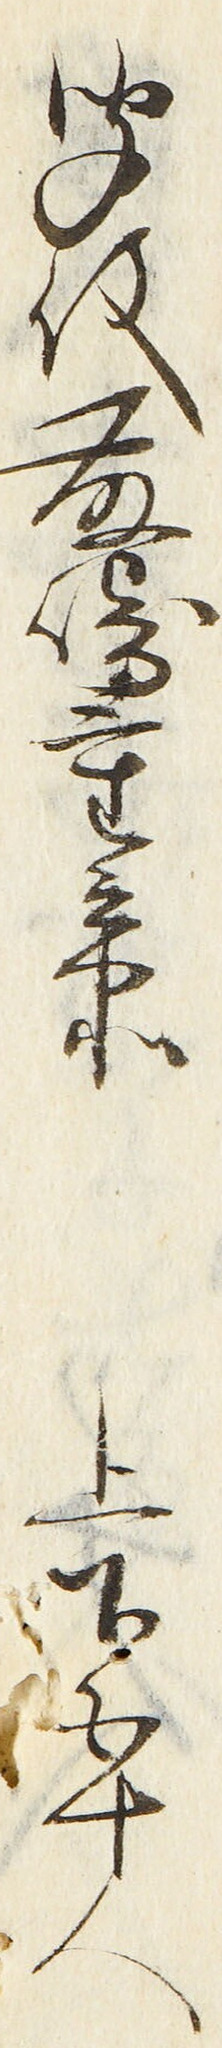聞役藤崎重兵衛上下五十人

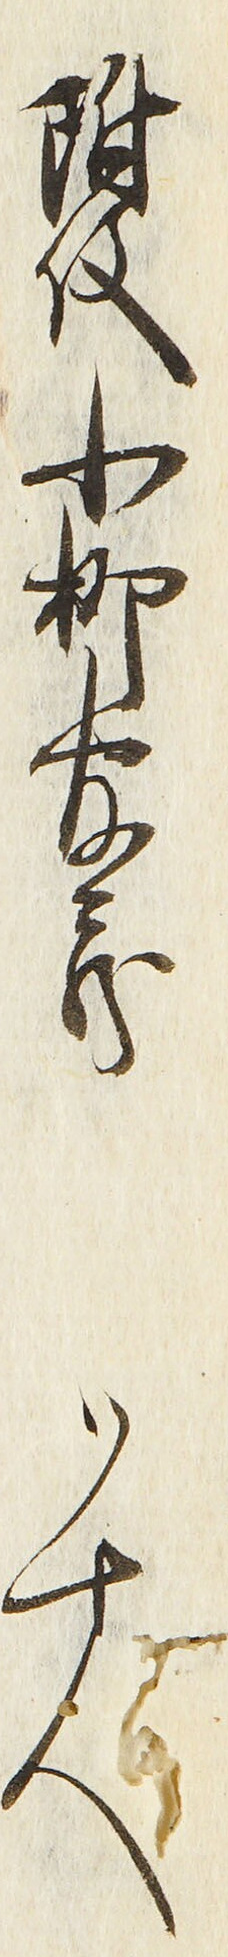附役小柳官蔵〃十人
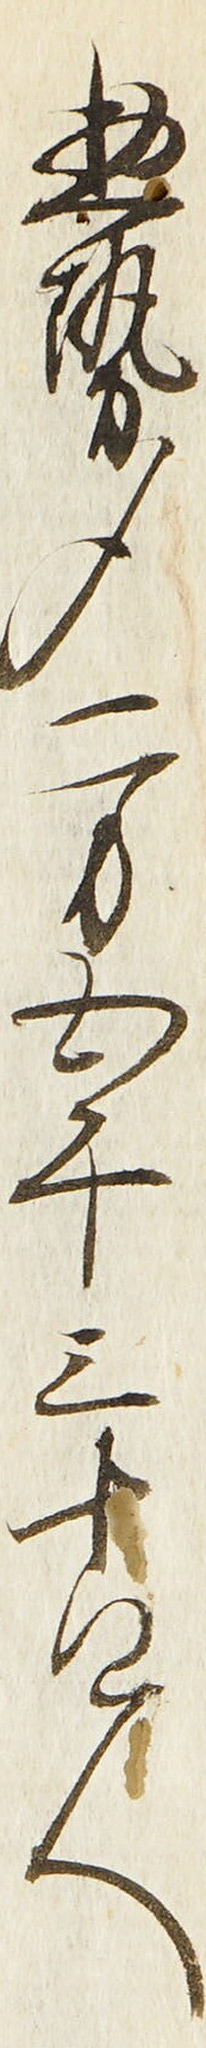惣勢〆一万五千三十四人
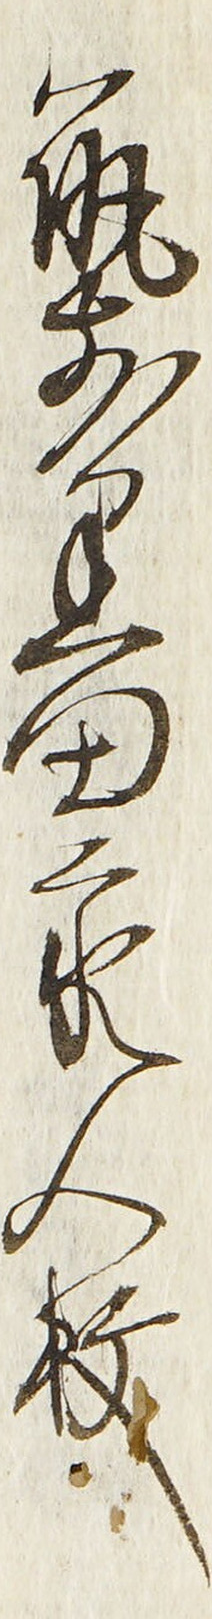筑前黒田家人数
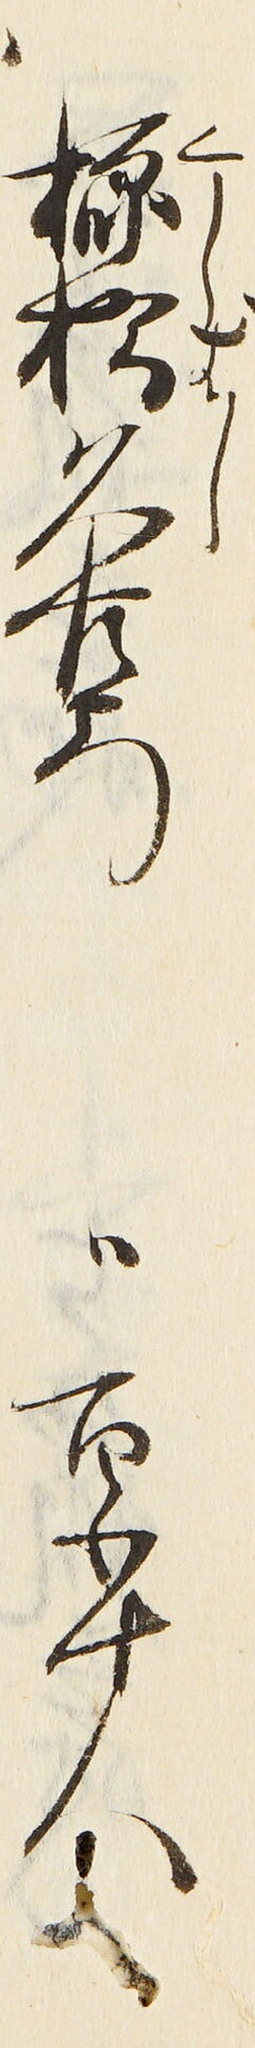櫛橋久左衛門〃百五十人
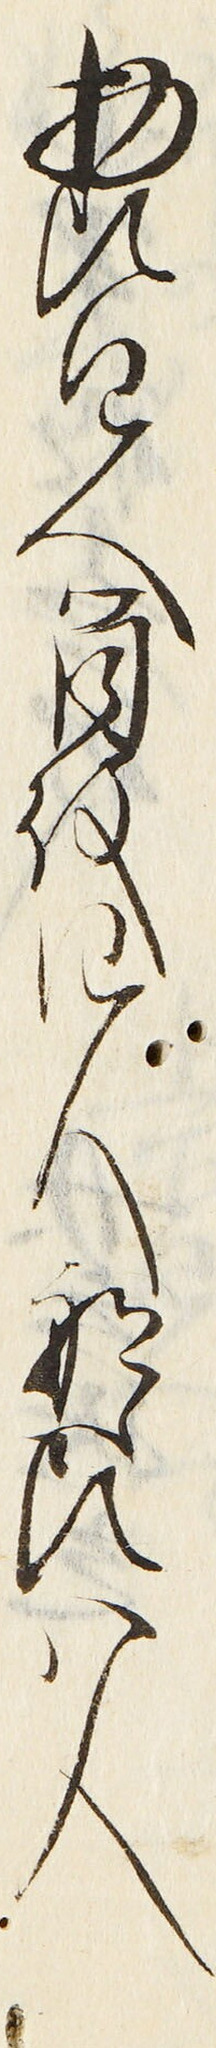物頭四人筒役四人船頭八人
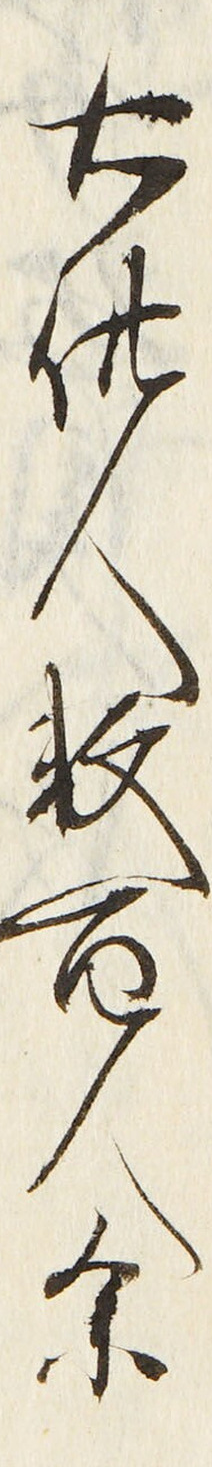右供人数百人余
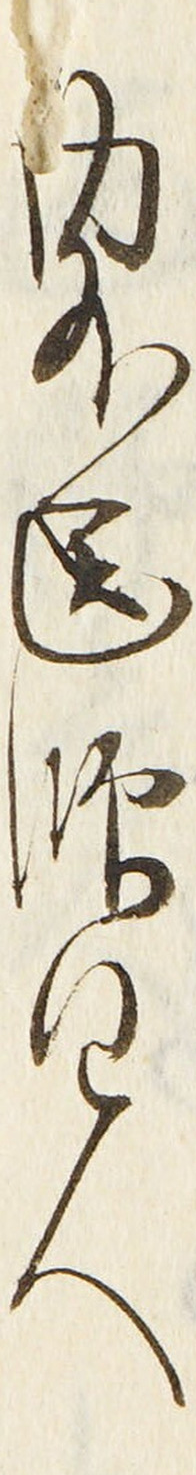内外医師四人
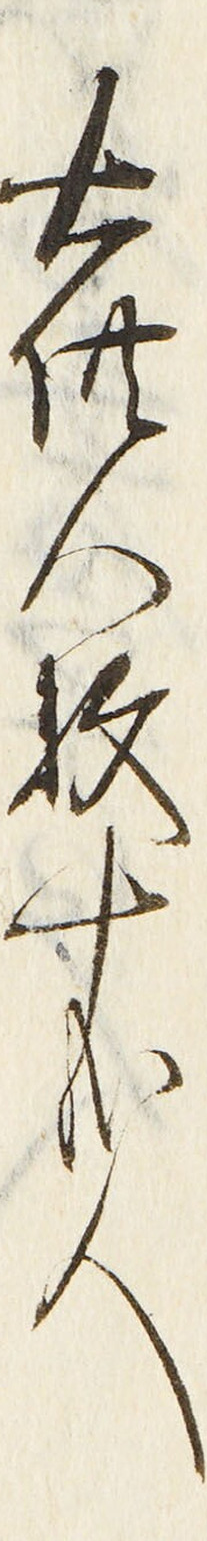右供人数十弐人
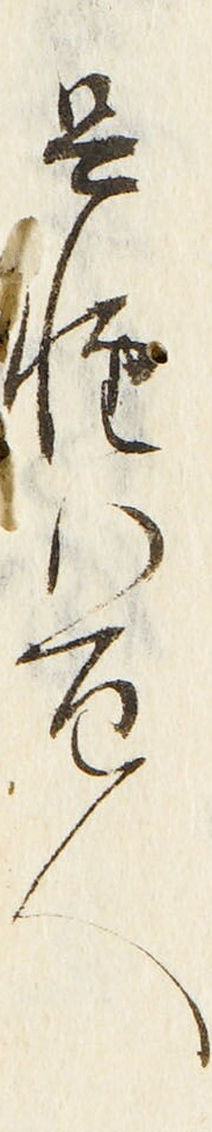足軽八百人
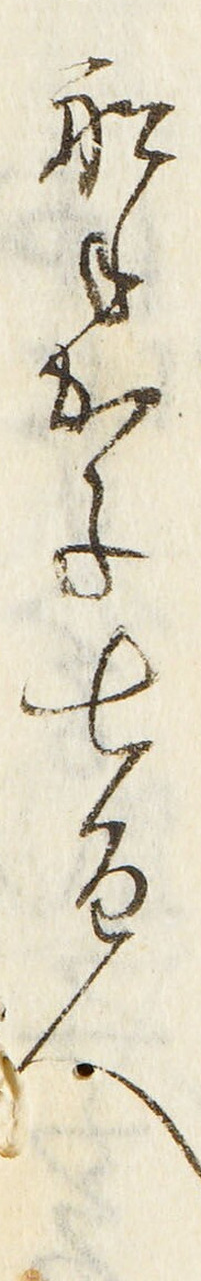船手加子七百人

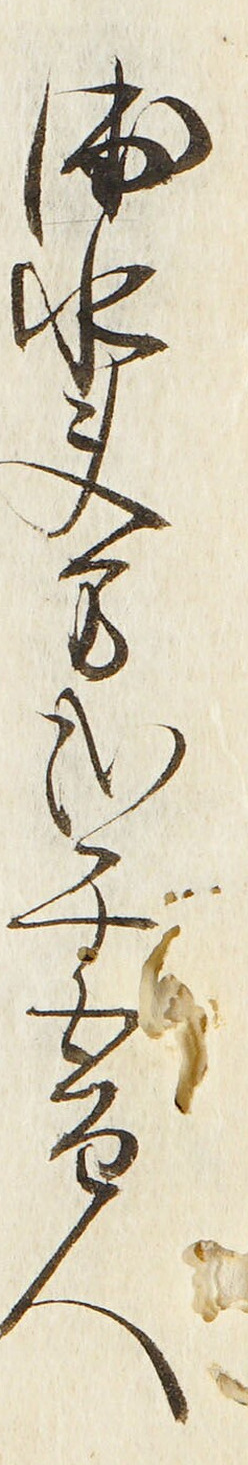浦水夫方弐千五百人
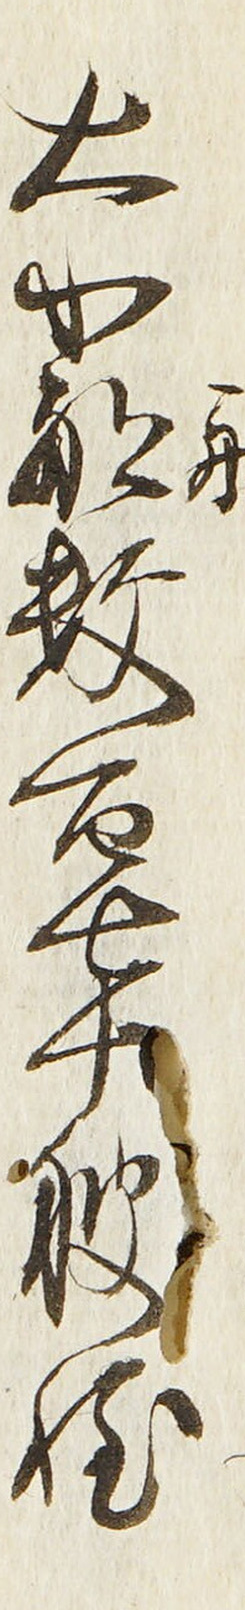大小船数百七十艘程
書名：魯西亜国舟渡来始末并日本流漂人異国遍歴之話（西洋欧羅巴州之内一）
